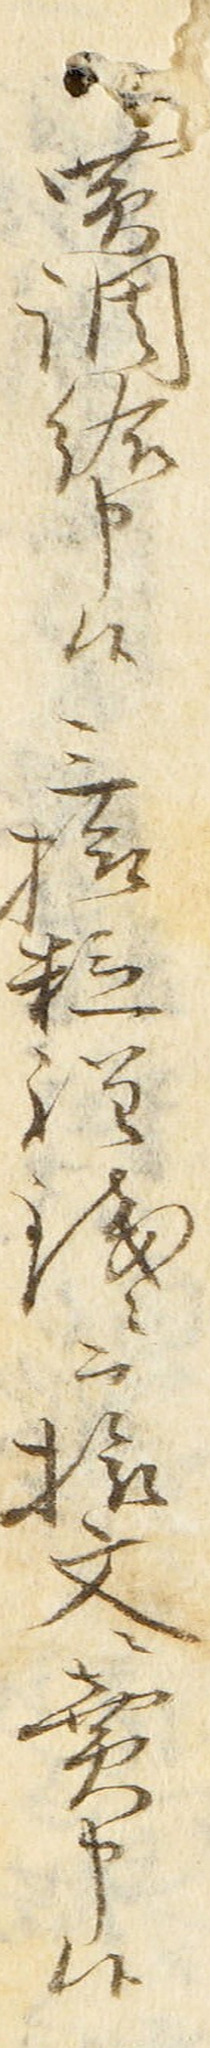買調給申候三拾粒程銭に而拾文に売申候
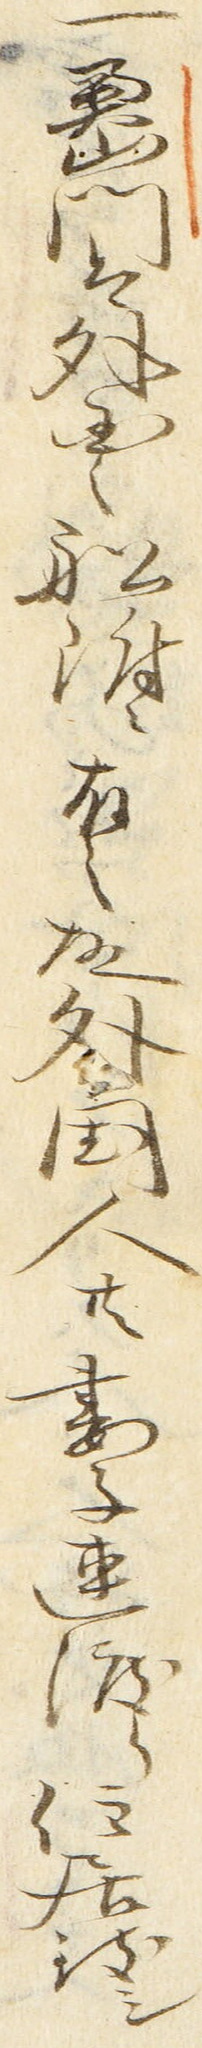一嶴門は外国之船附に有之故外国人共妻子連渡り住居致し
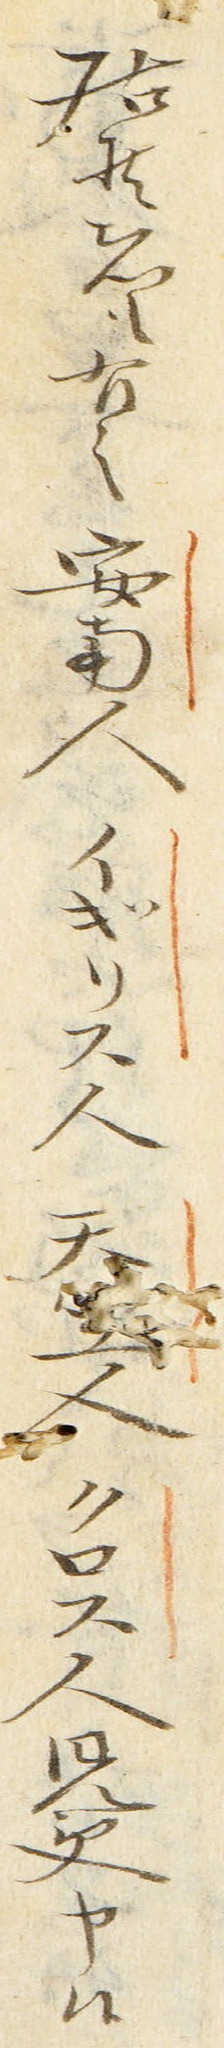居候者も有之安南人イギリス人天竺人クロス人見受申候

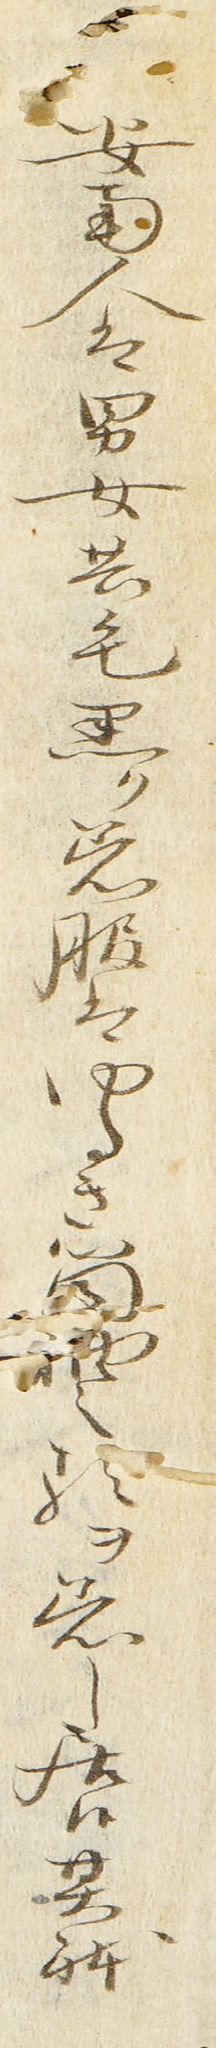安南人は男女共毛黒く着服はゆるき筒袖之類を着し居候其躰
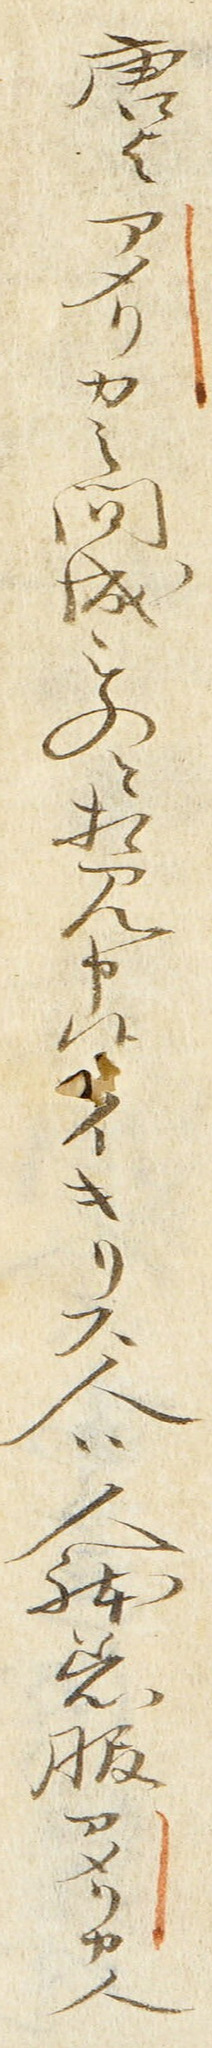唐はアメリカ之間成ものと相見申候イキリス人は人躰着服アメリカ人
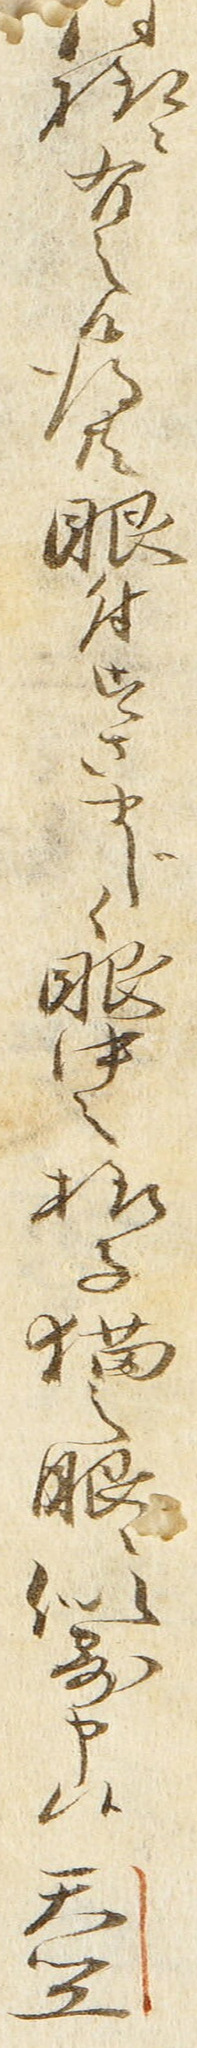同様に有之候得共眼付すさまじく眼中之様子猫之眼に似寄申候天竺
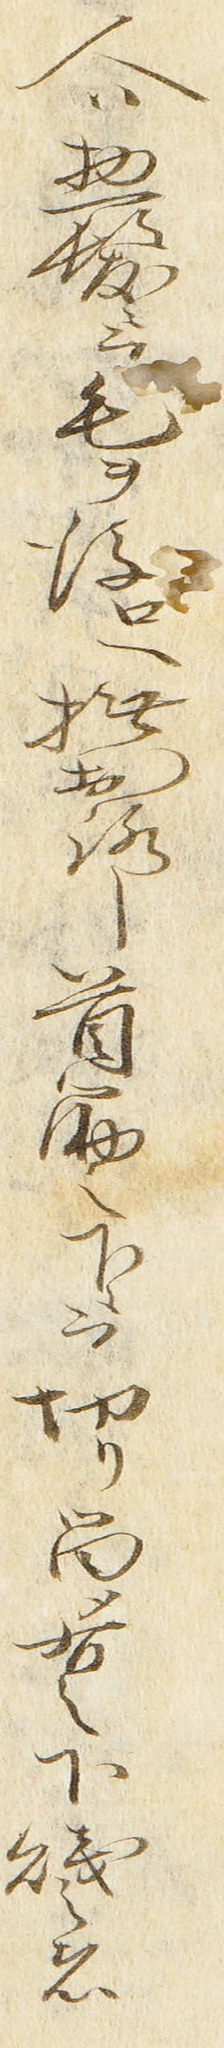人は惣髪に而毛を後口へ撫おろし首筋之下に而切り留して有之下賤之者
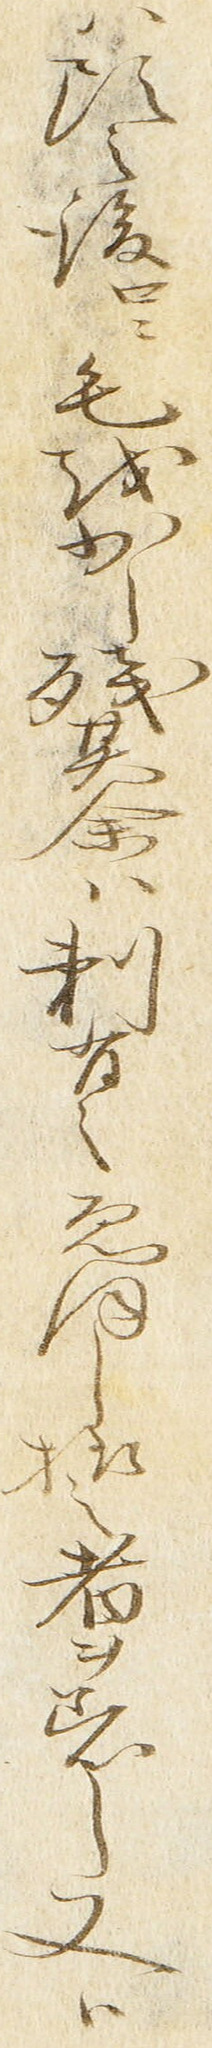は頭之後口に毛を少し残其余は刺有之ゑほし様之者を着し又は
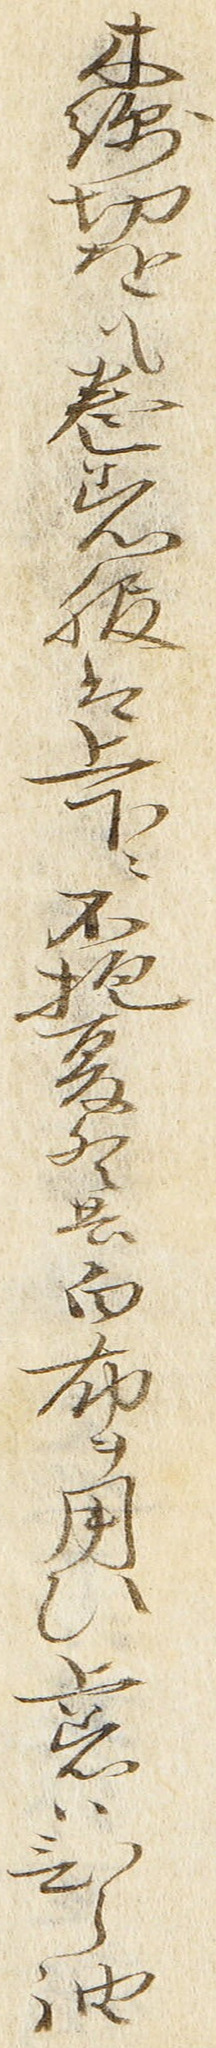木綿切をも巻着服は上下に不抱夏冬共白布を用ひ上着はひし袖
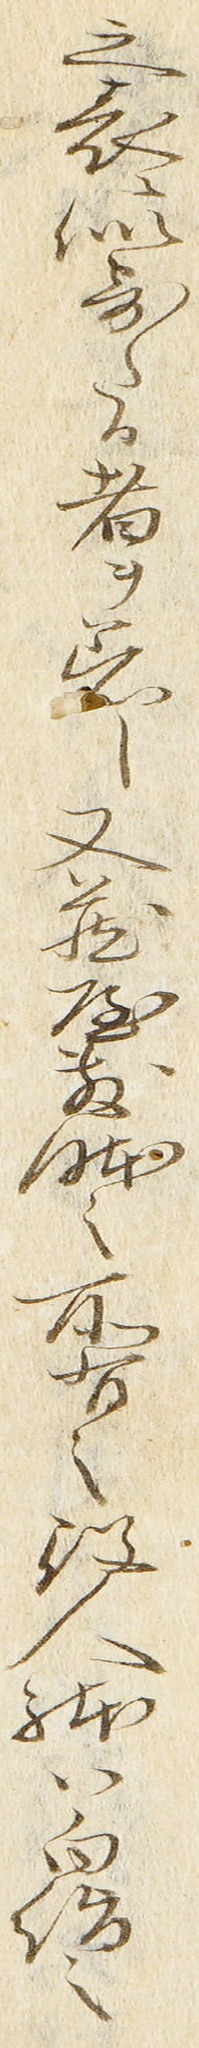之衣に似寄たる者を着し又蔵屋敷躰之所有之役人躰は白緒之
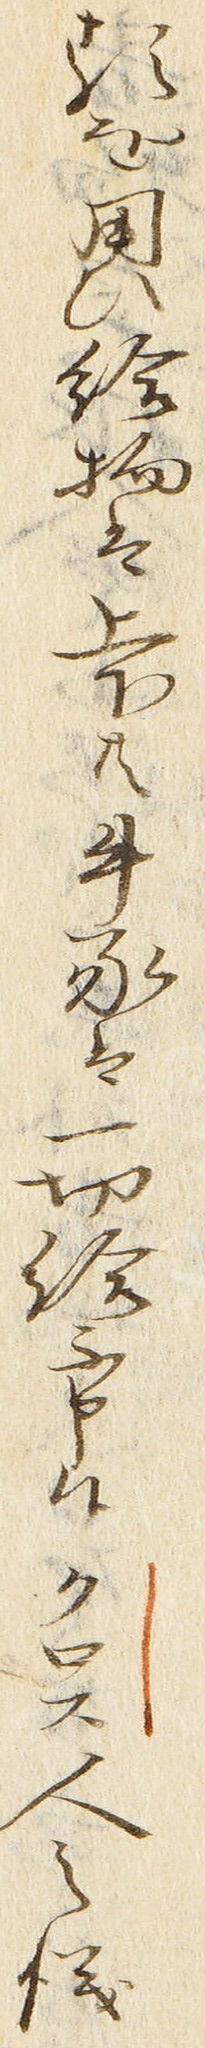類を用ひ給物は上下共牛承は一切給不申候クロス人之儀
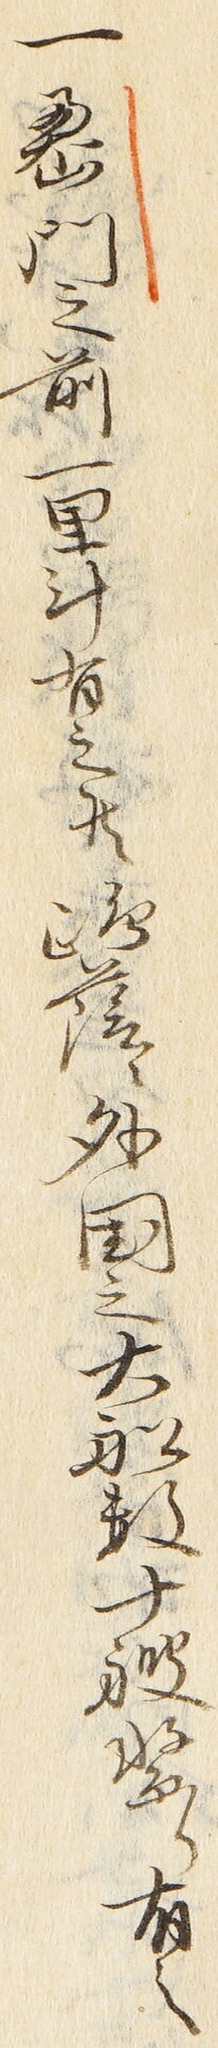一嶴門之前一里斗有之共鷗蕯外国之大船数十艘り有之
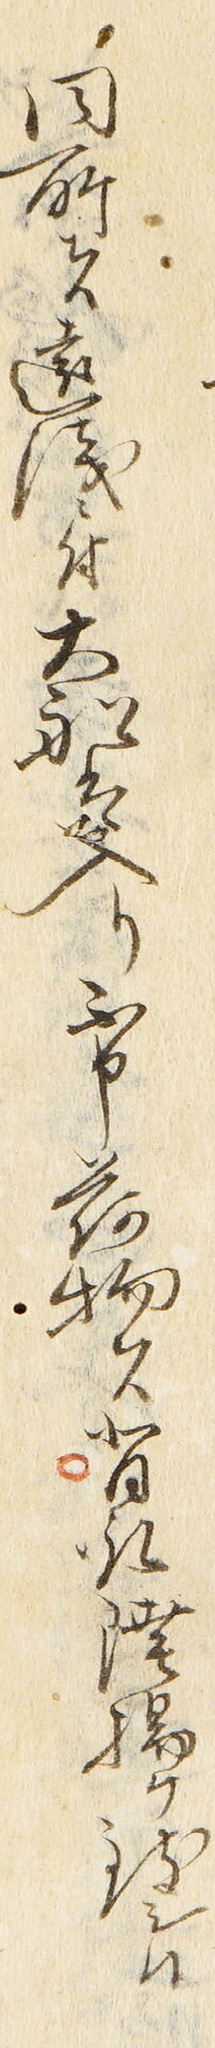同所者遠浅に付大船は入り不申荷物は背取陸揚け致し候
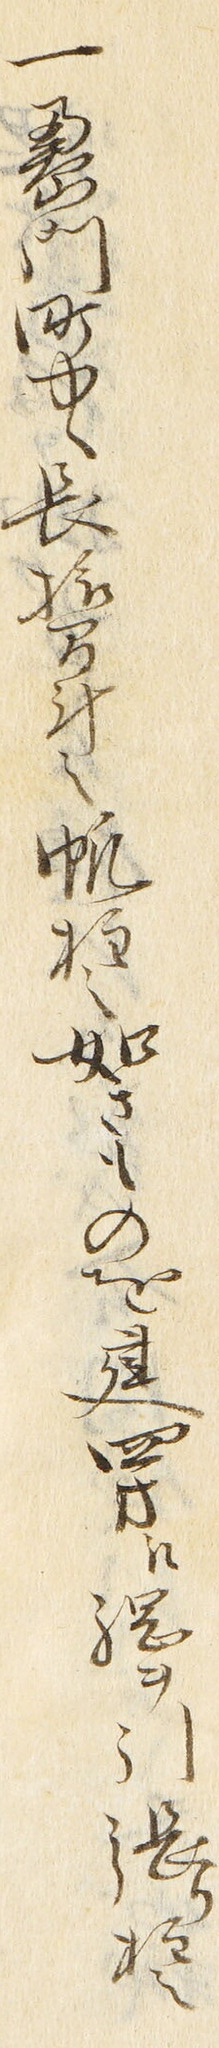一嶴門町中長拾間斗之帆柱之如きものを建四方江綱を引張り柱之
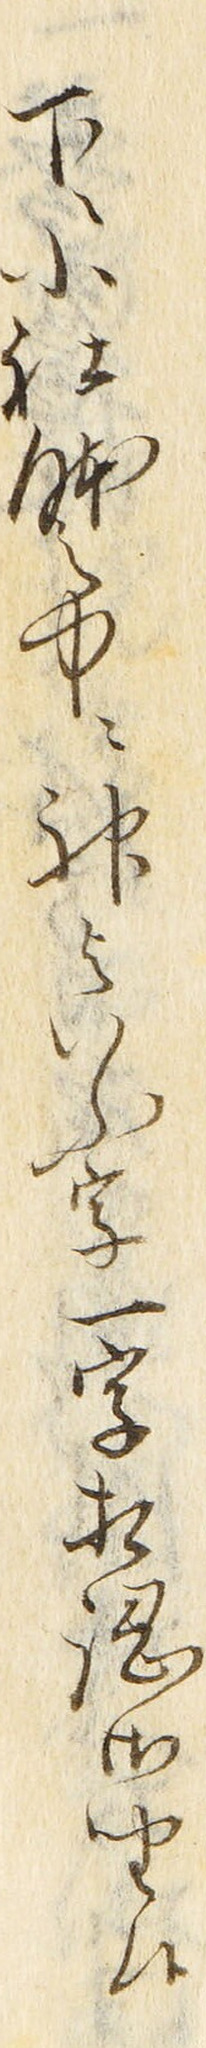下に小社躰之中に神といふ字一字相認御座候
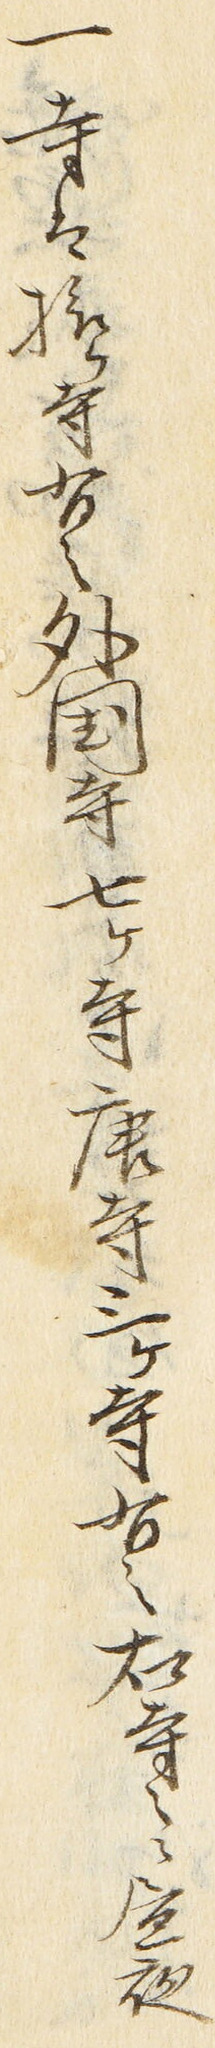一寺は拾ヶ寺有之外国寺七ヶ寺唐寺三ヶ寺有之右寺々に昼夜
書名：漂流人弥市之記
